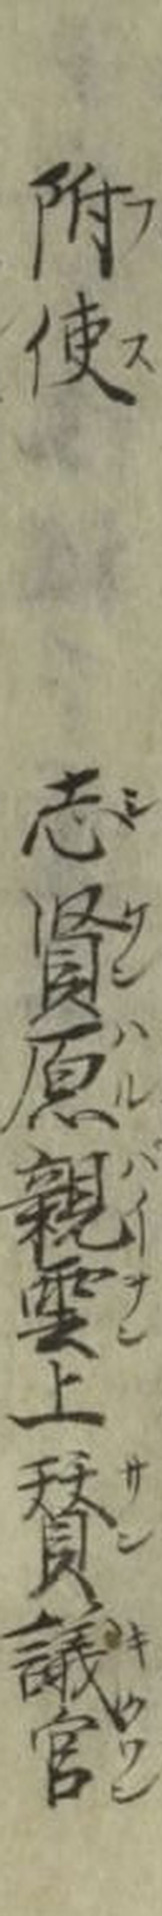附使志賢原親雲上賛議官
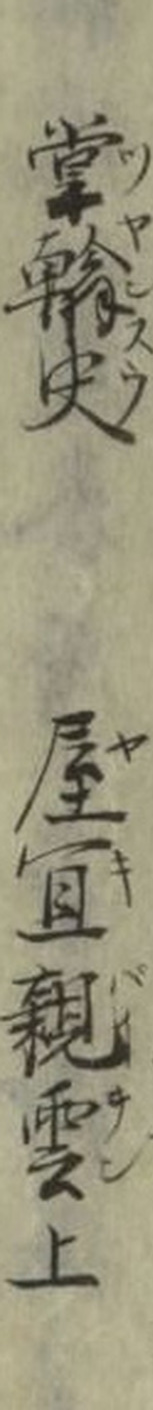掌翰史屋宜親雲上
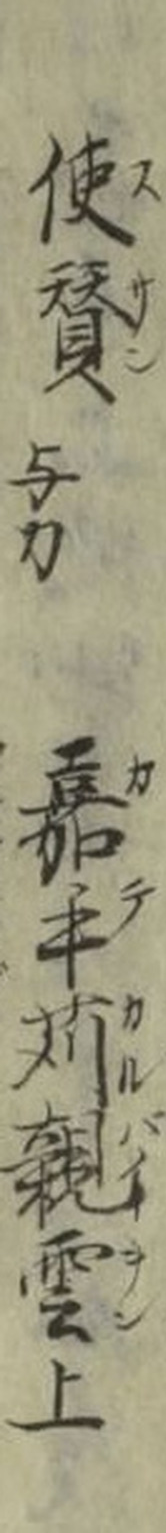使賛与力嘉手刈親雲上
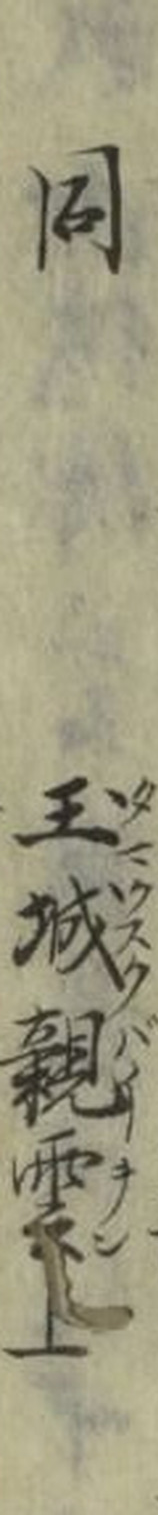同玉城親雲上
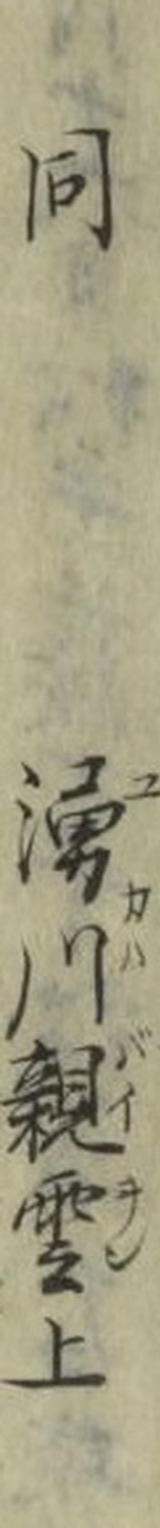同湧川親雲上
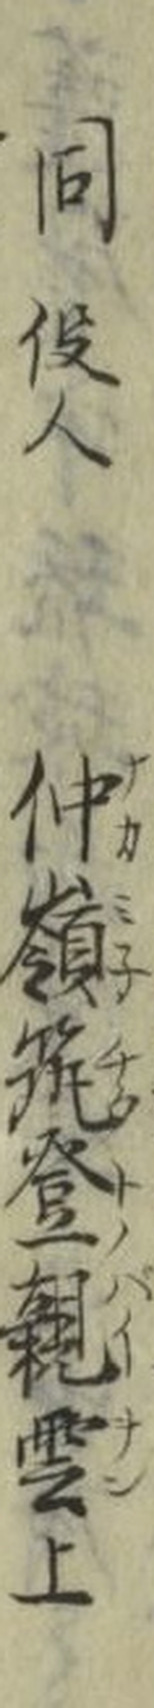同役人仲嶺筑登親雲上
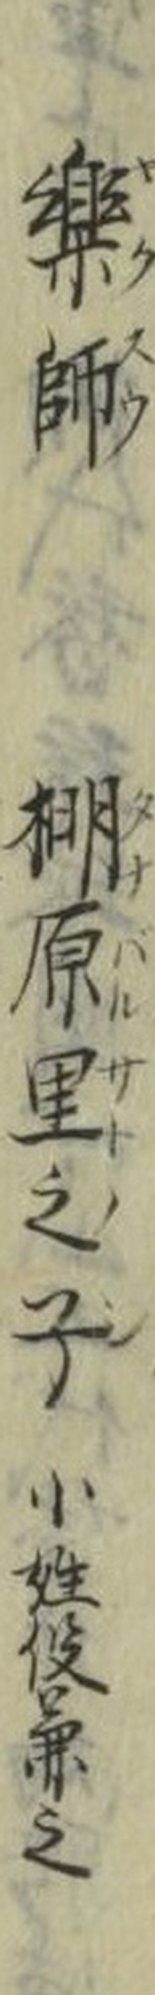楽師棚原里之子小姓役兼之
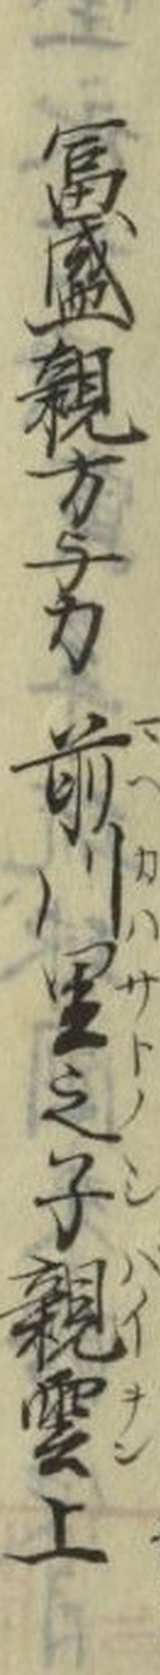富盛親方与力前川里之子親雲上
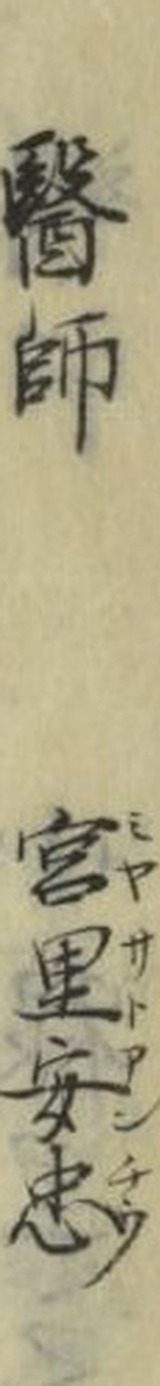医師宮里安忠
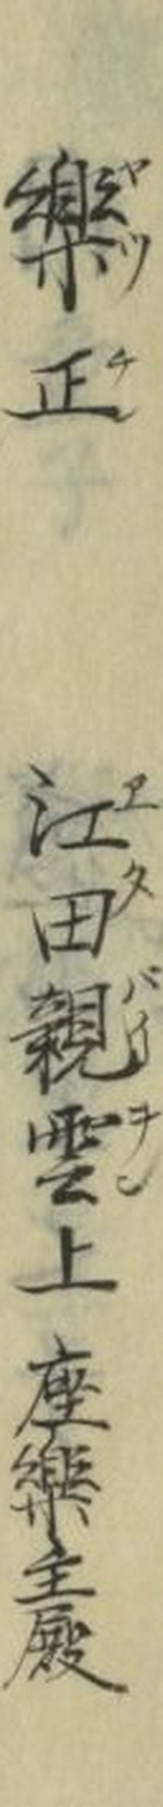楽正江田親雲上座楽主殿
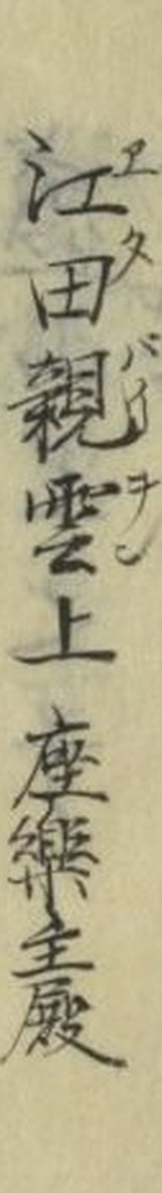楽正江田親雲上座楽主殿
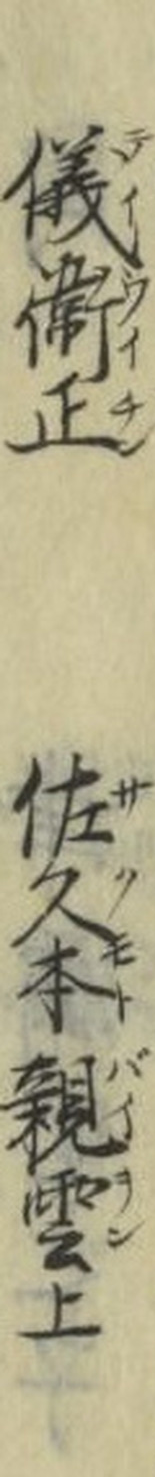儀衛正佐久本親雲上
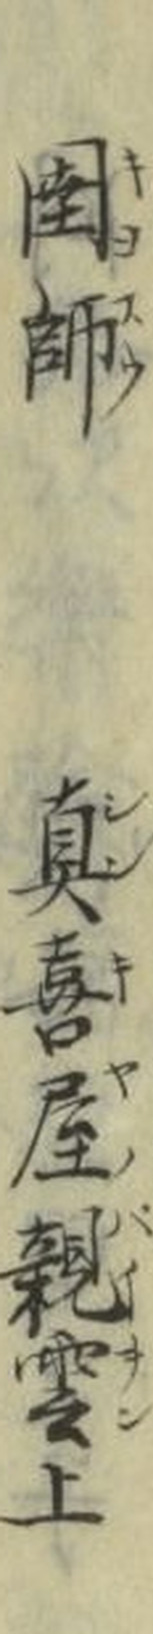囲師真喜屋親雲上
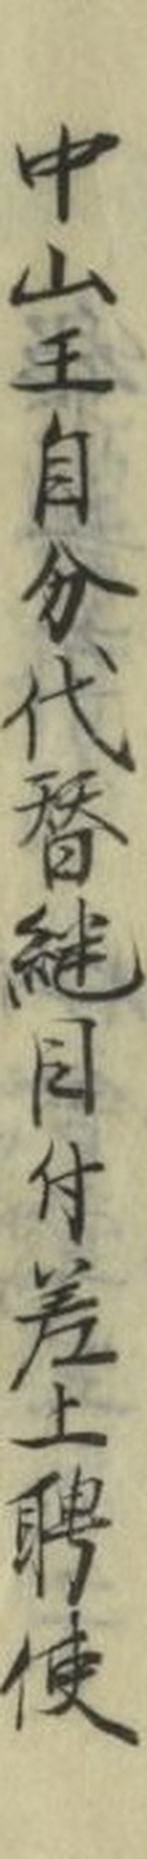中山王自分代替継目付差上聘使
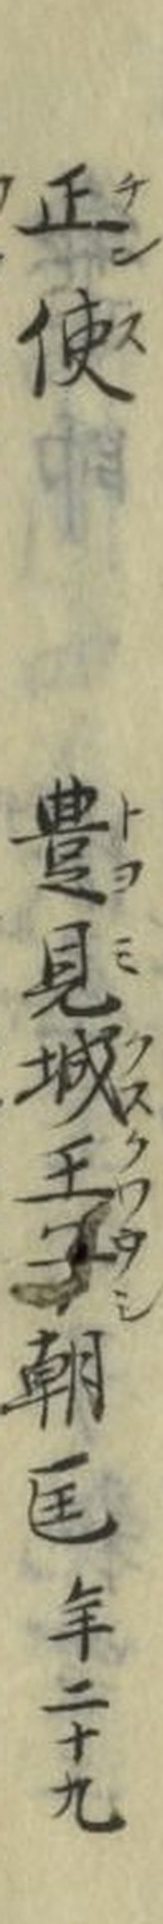正使豊見城王子朝匡年二十九
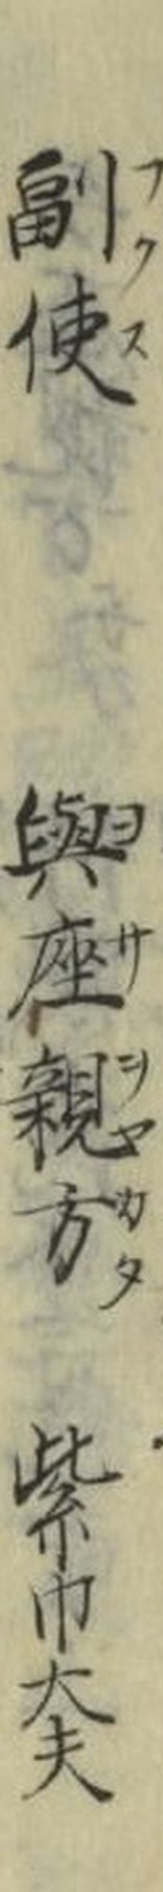副使与座親方紫巾大夫
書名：宝永七庚寅年琉球国来聘使日記
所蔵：University of the Ryukyus Library
